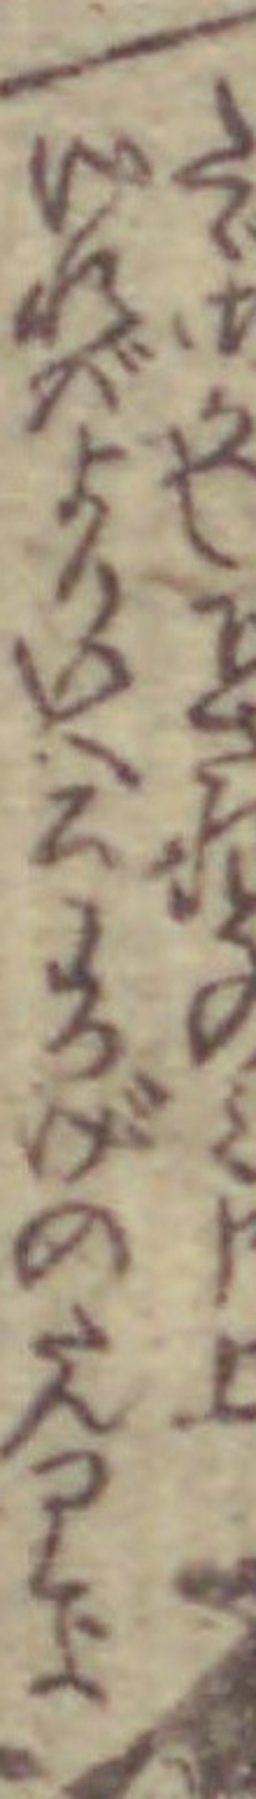ければよりいへ公わかげのたんりよ
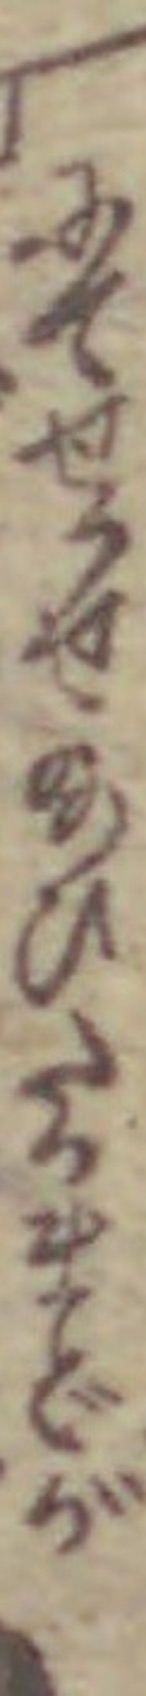にてせかせ給ひたかまどが
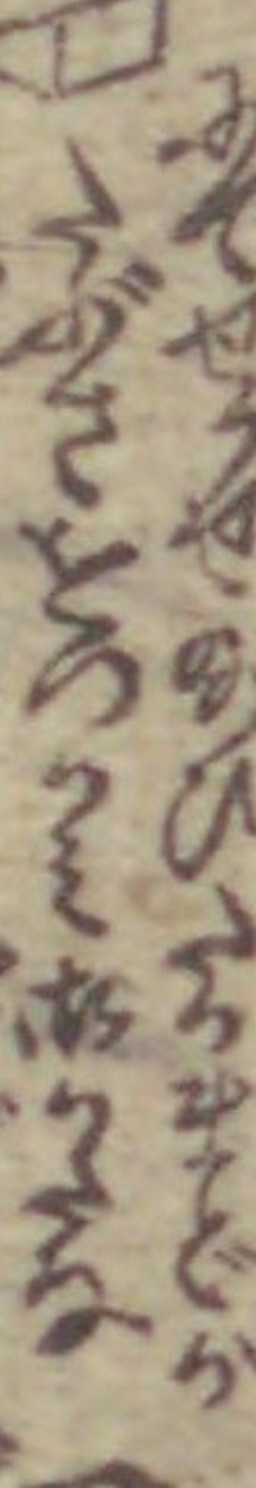たぶさをつかみ御かたな
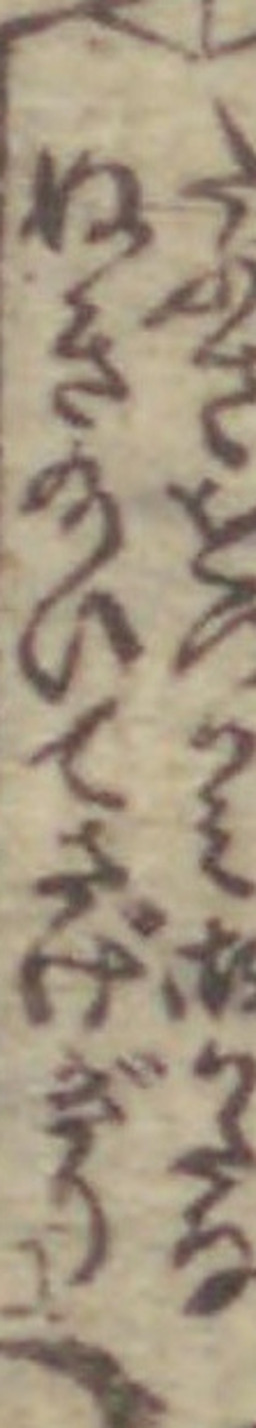ぬき給ひてさげぎり

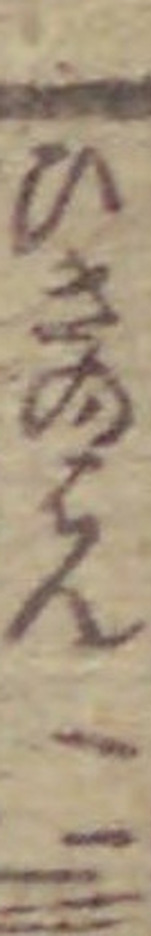ひきのはん
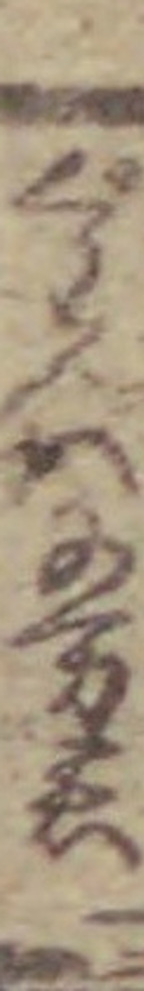ぐわんは千万君
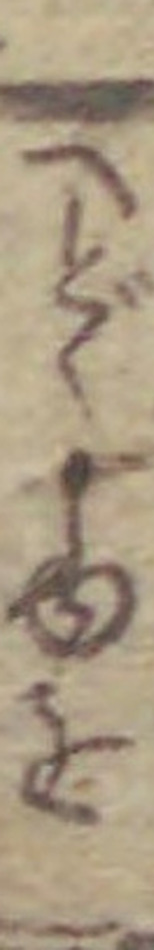へどくしゆを
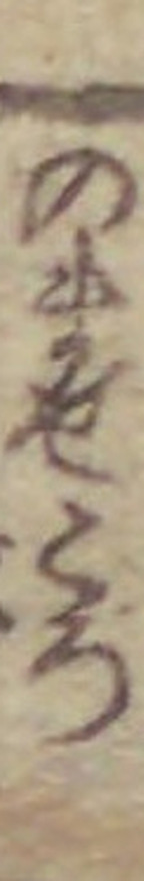のませころ
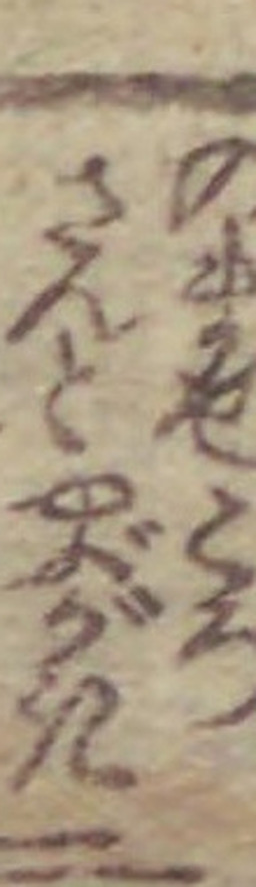さんとやぶがき
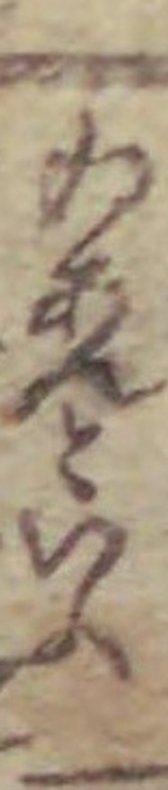ゐあんといふ
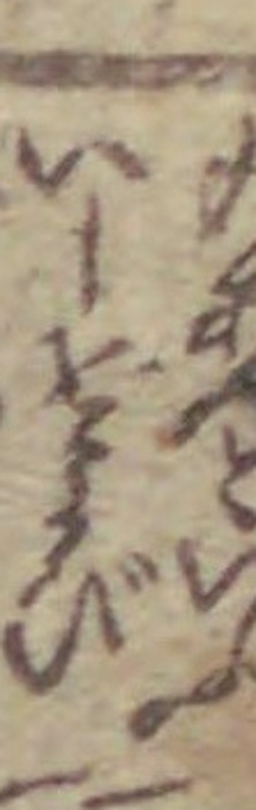いしをよび
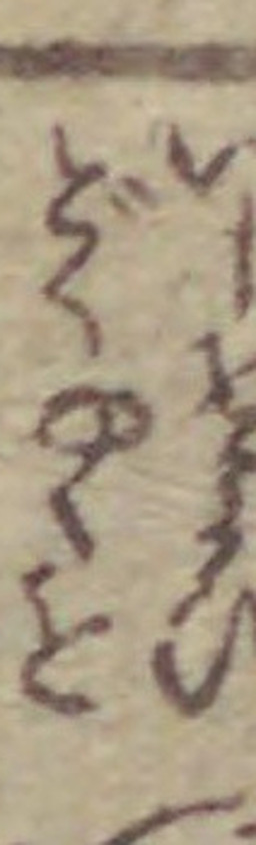どくやくを
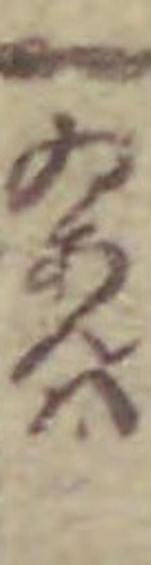ゐあんは
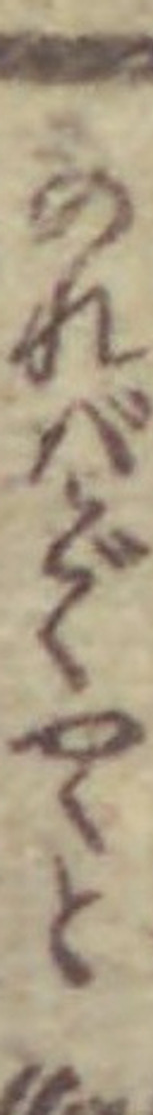なればどくやくと
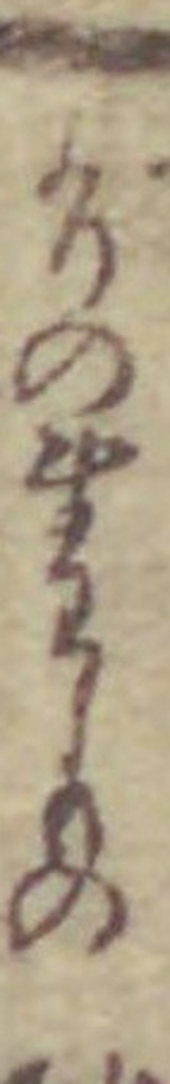よりのまわしもの
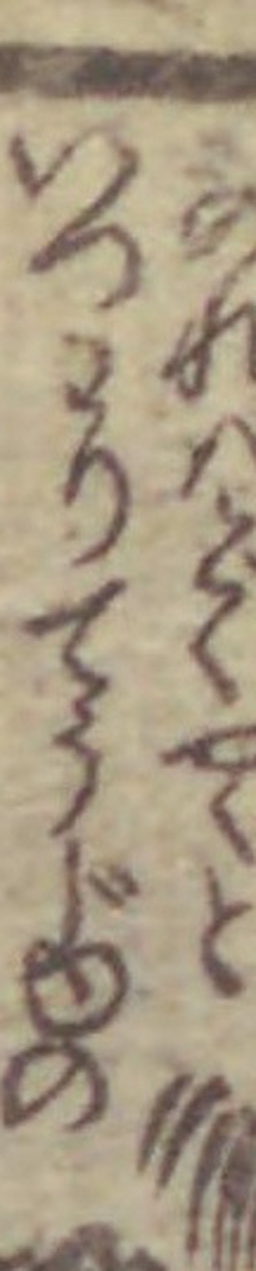いつわりてうじゆの
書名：鎌倉山紅葉浮名
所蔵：国立国会図書館 National Diet Library, JAPAN
